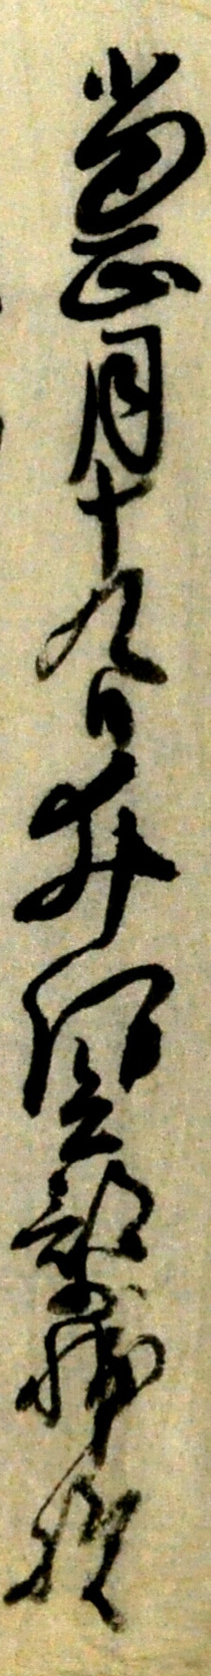当正月十九日井伊兵部少輔様
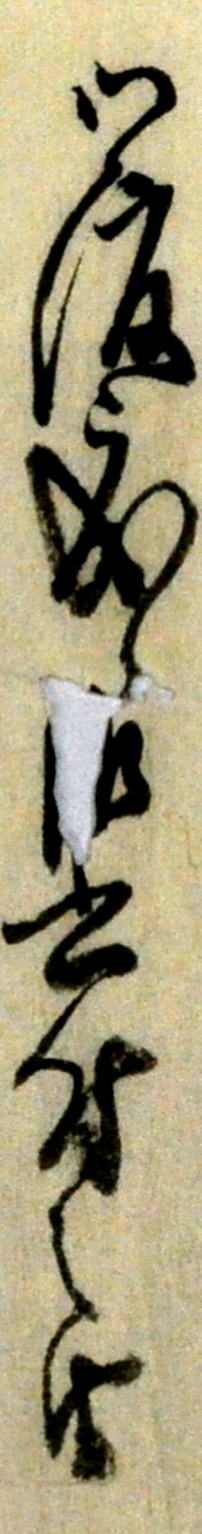御渡被成候御書付之由
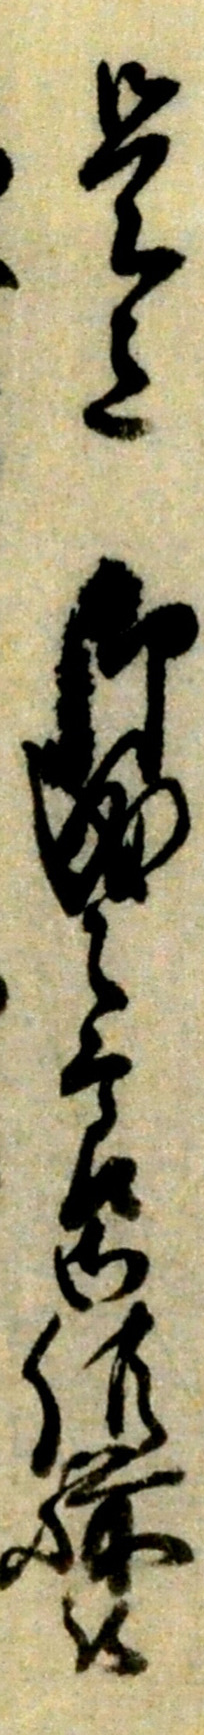是迄御成之節御供揃被
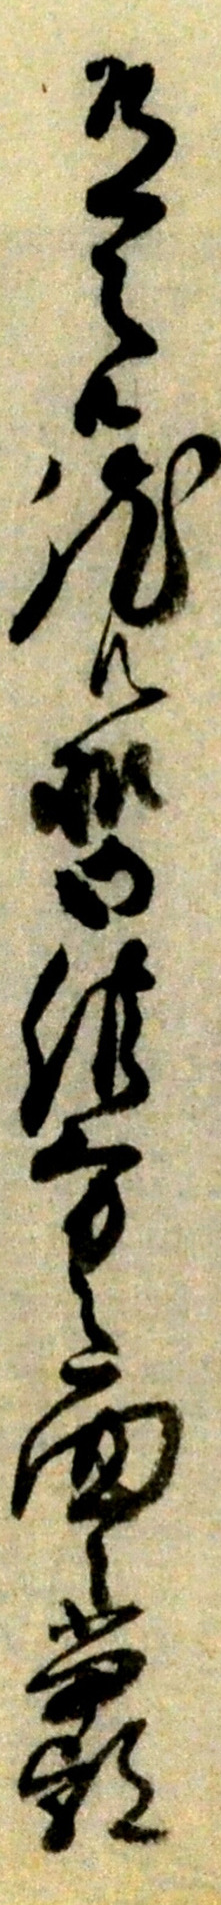有之候然ル処御供方之面々当
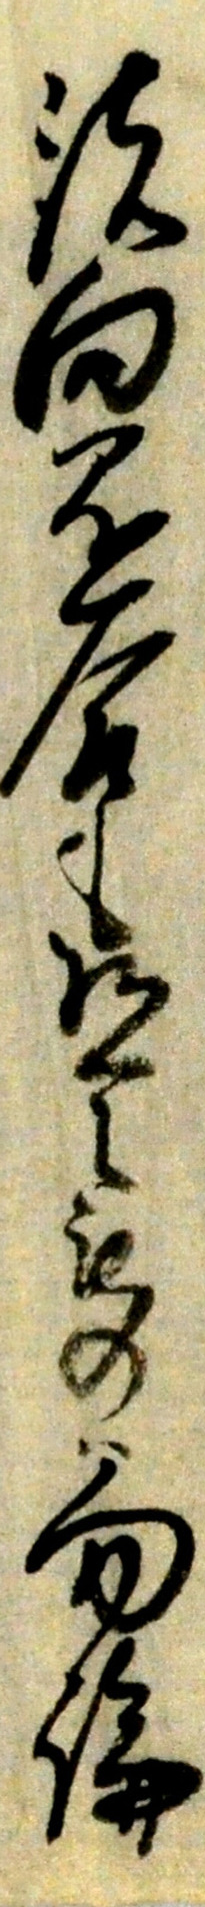諸向懸合も有之ものハ勿論
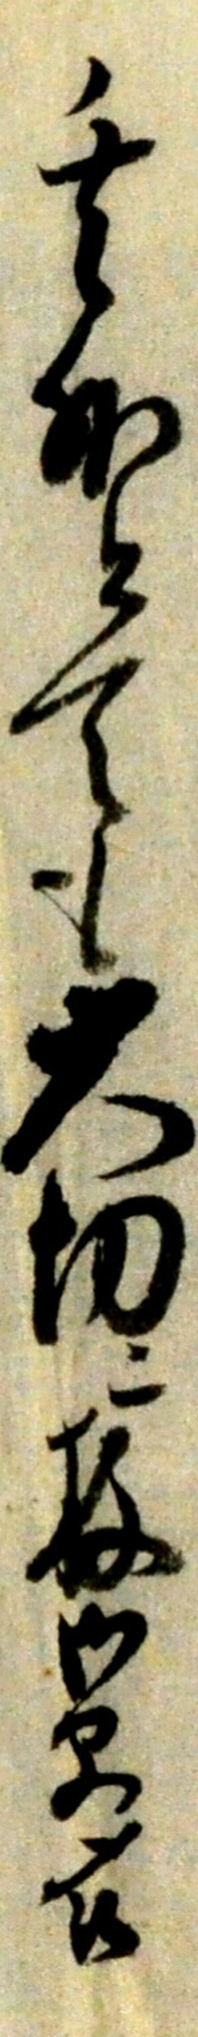其外ニても大切ニ存御早メ被
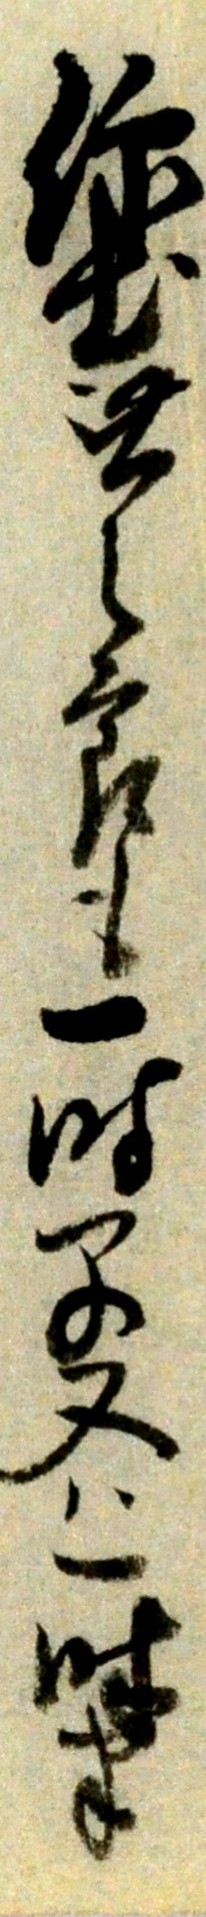仰出無之節も一時早又ハ一時半
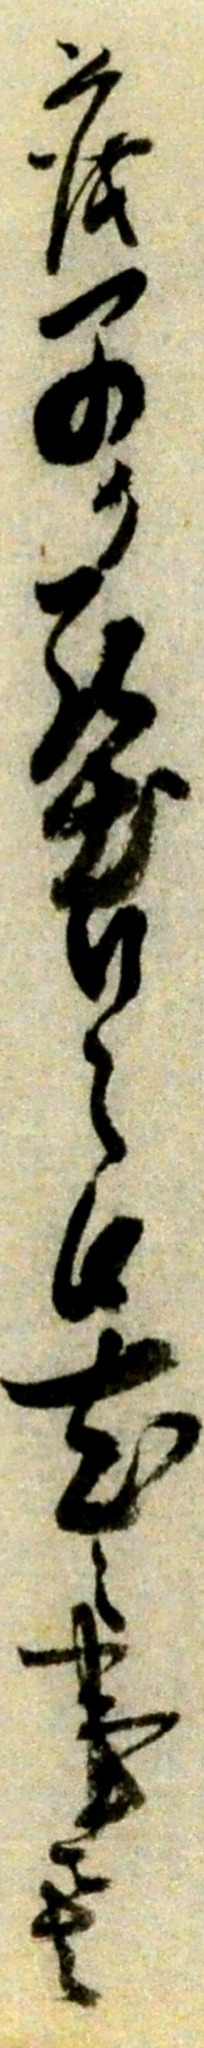茂早ク罷出候之由尤之事ニ者
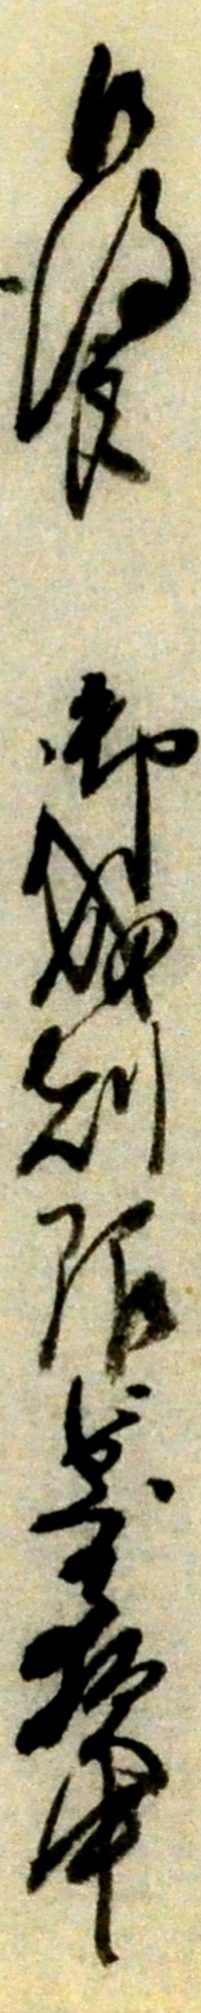候得共御成刻限ニ寄夜中
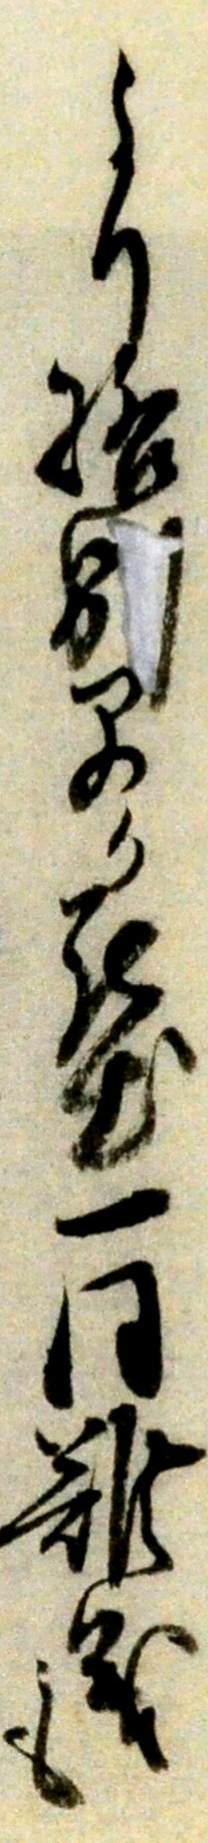より格別早ク罷出一同難義ニも
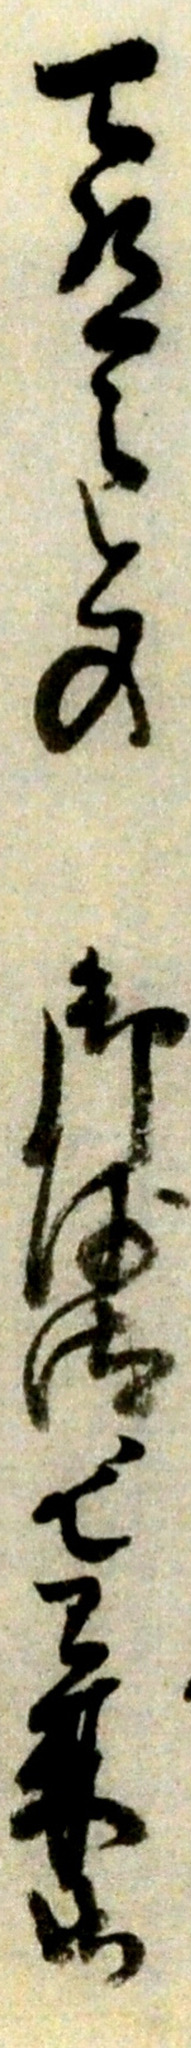可有之との御沙汰ニて已来御
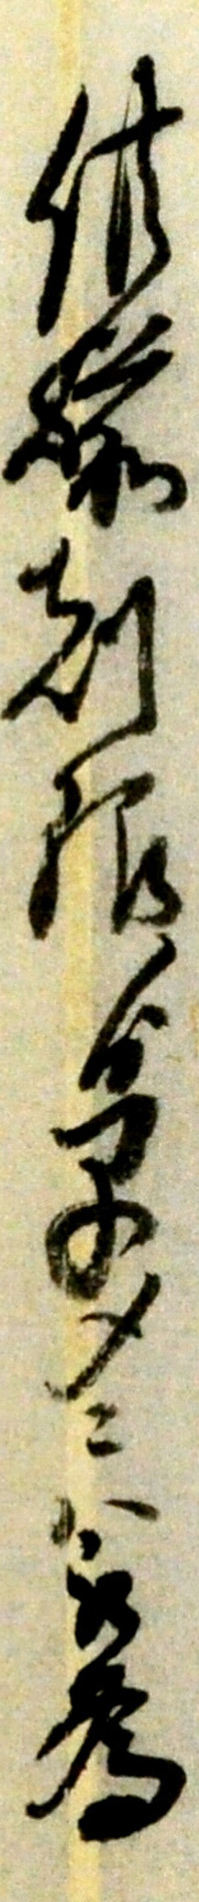供揃刻限ゟ早メニハ被為
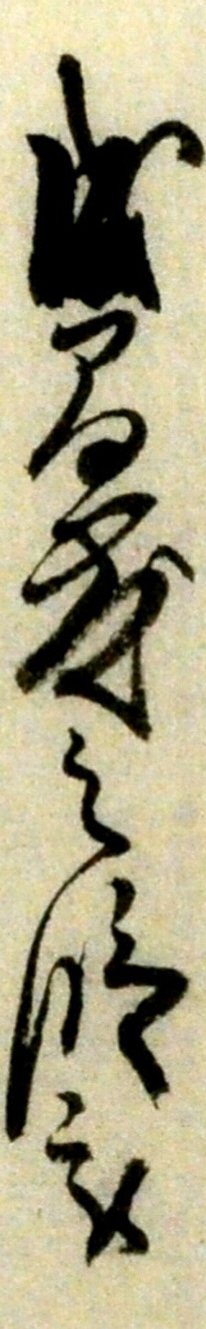成間敷之段被
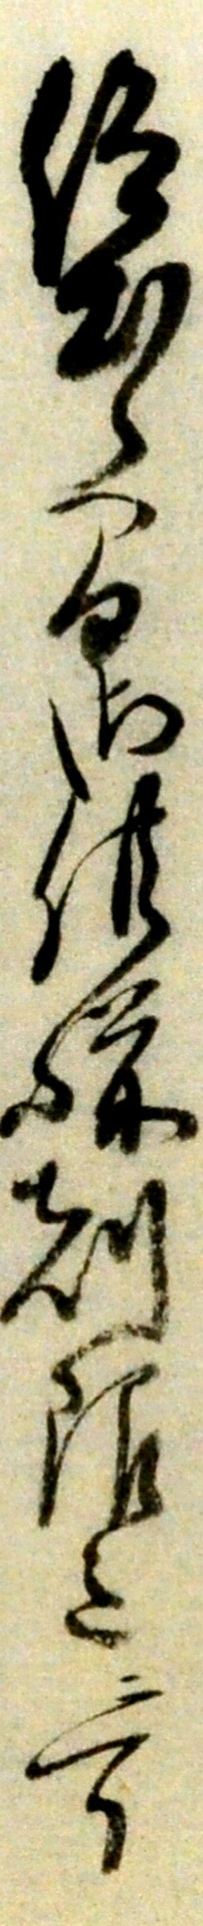仰出候間御供揃刻限迄ニ可
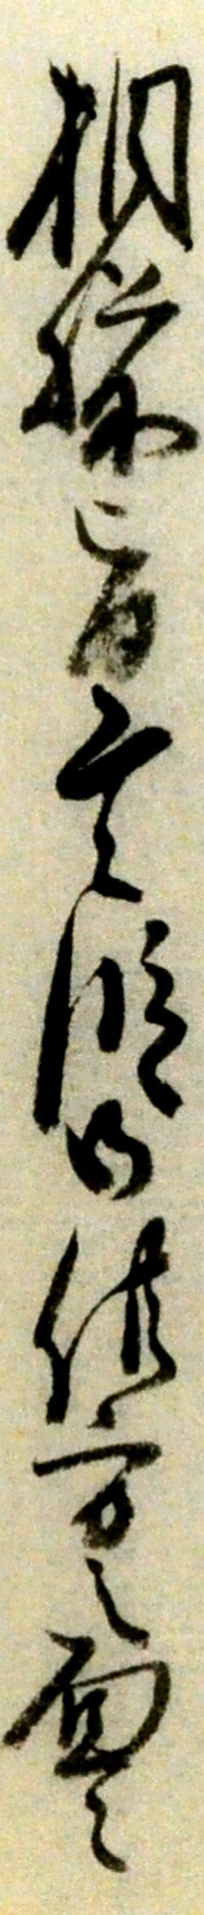相揃旨其段御供方之面々
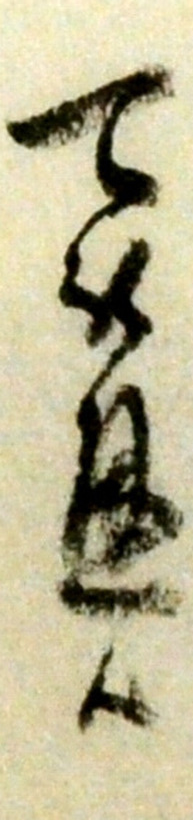可被通候
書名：申合帳〔一括〕
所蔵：伊那市立高遠町図書館・合同会社AMANE
